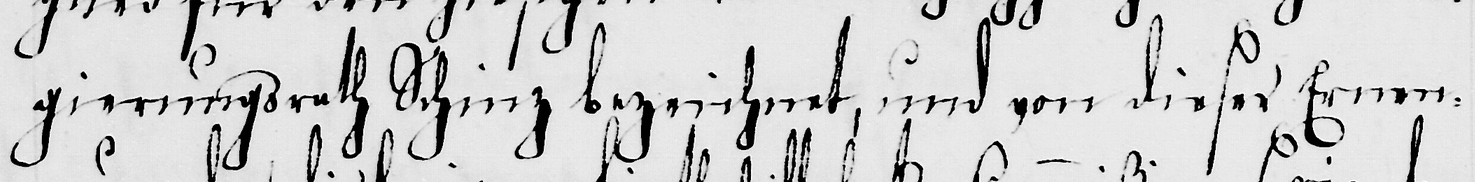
gierungsrath Schinz bezeichnet, und von dieser Ernen¬
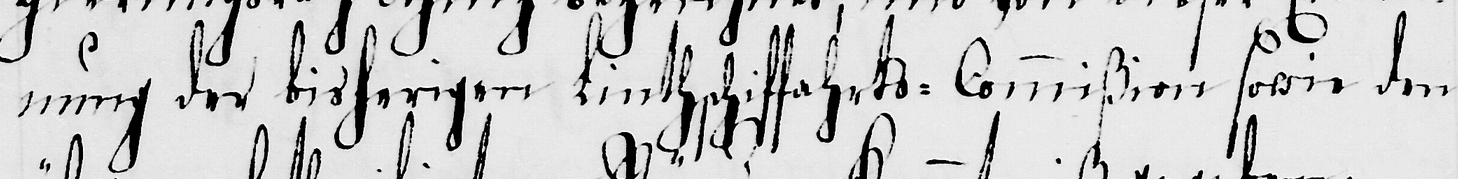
nung der bisherigen Linthschiffahrts-Commißion sowie den
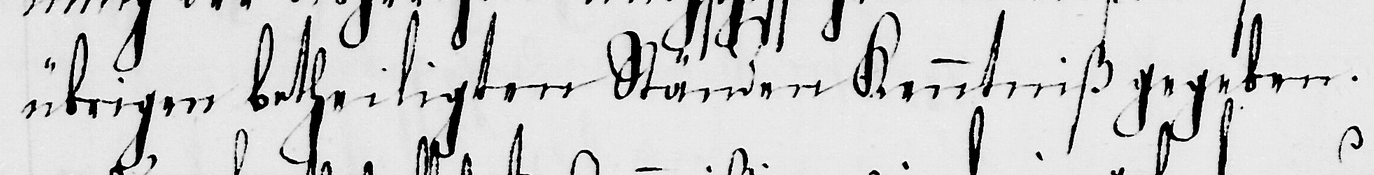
übrigen betheiligten Ständen Kenntniß gegeben.
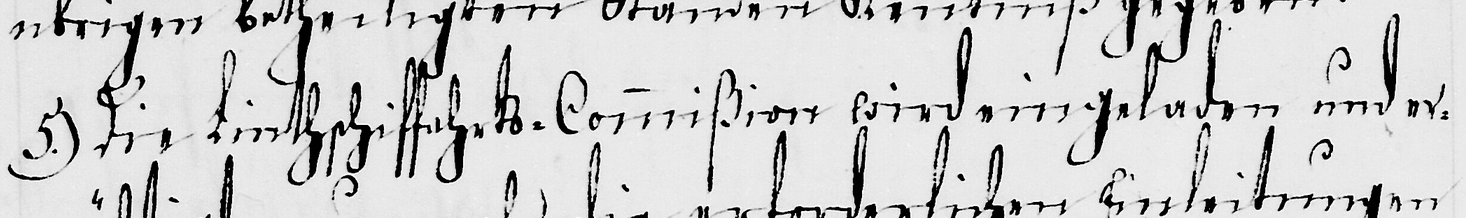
5.) Die Linthschiffahrts-Commißion wird eingeladen und er¬
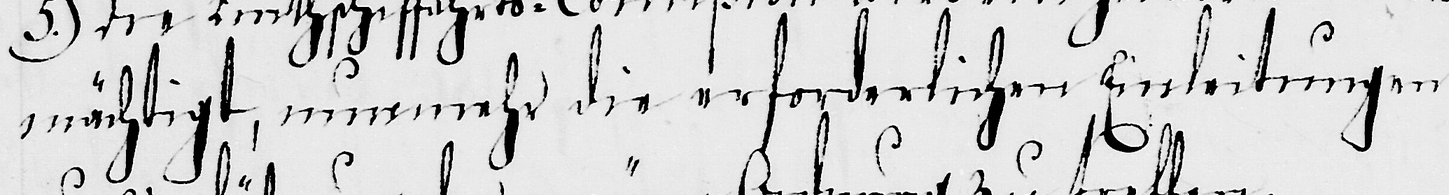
mächtigt, nunmehr die erforderlichen Einleitungen
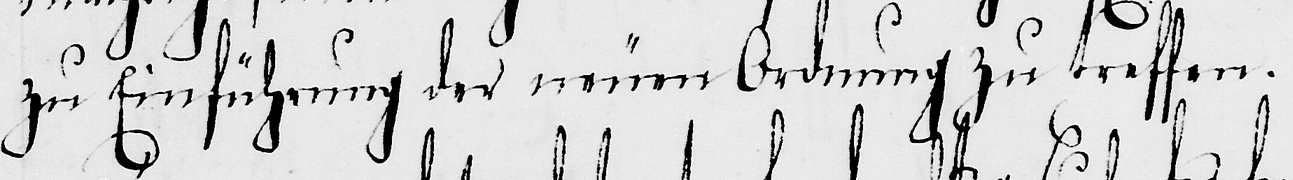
zu Einführung der neuen Ordnung zu treffen.
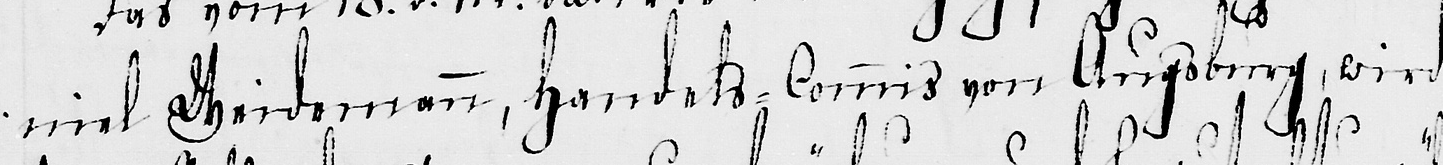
niel Weidemann, Handels-Commis von Augsburg, wird
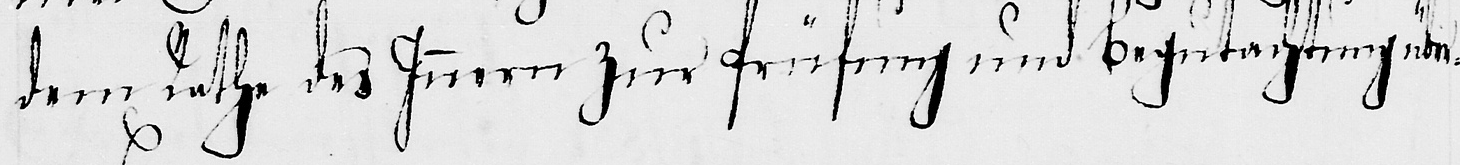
dem Rath des Innern zur Prüfung und Begutachtung übe¬
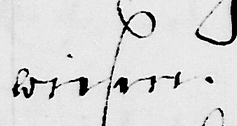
rwiesen.
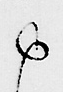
Da¬
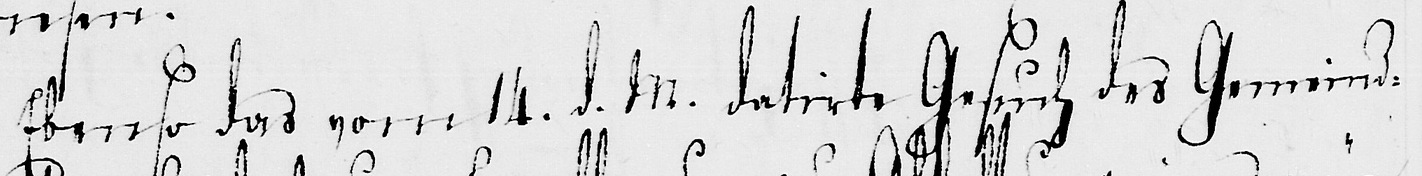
Ebenso das vom 14. d. M. datirte Gesuch des Gemeind¬
